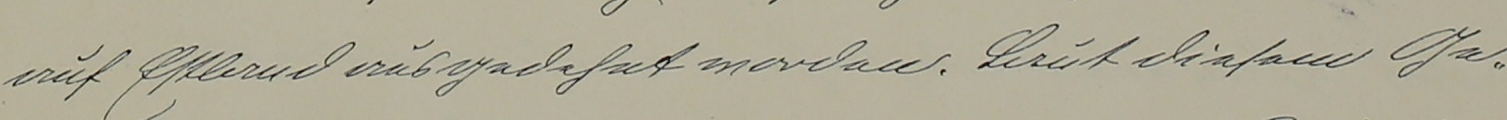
auf Estland ausgedehnt worden. Laut diesem Ge-
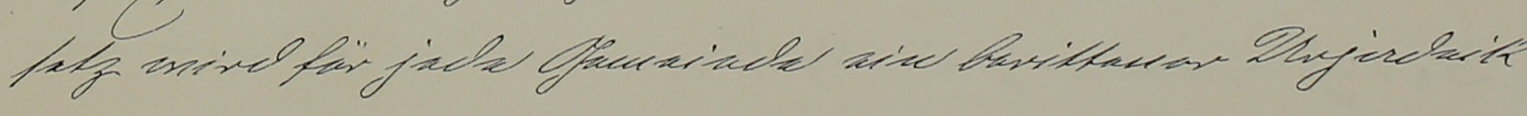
setz wird für jede Gemeinde ein berittener Urjadnik
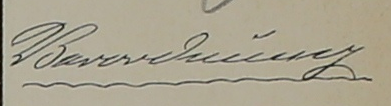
Verordnung
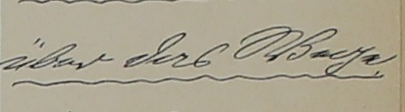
über das Wege-
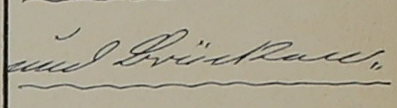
und Brücken-
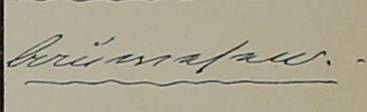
bauwesen.
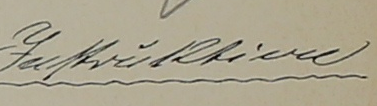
Instruktion
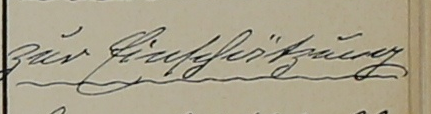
zur Einschätzung
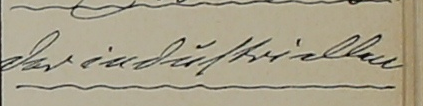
der industriellen
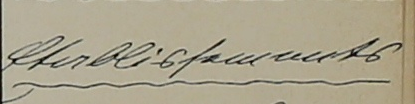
Etablissements
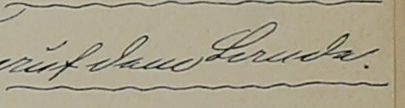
auf dem Lande.
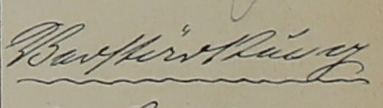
Verstärkung
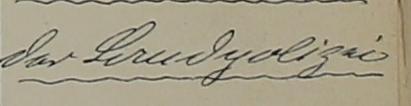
der Landpolizei
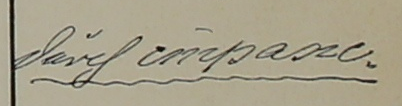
durch страж-
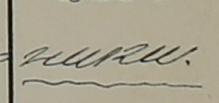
ники.
